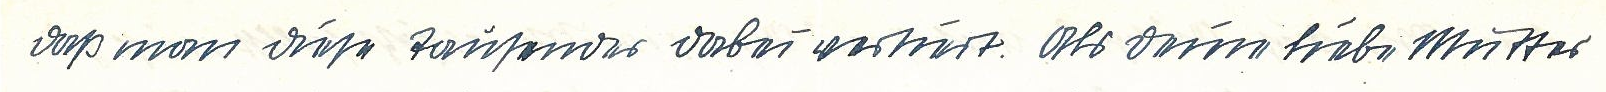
daß man diese Tausender dabei verliert. Als Deine liebe Mutter
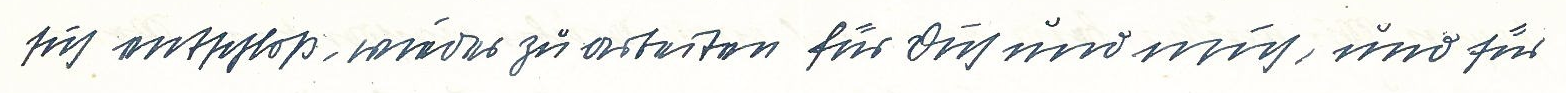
sich entschloß, wieder zu arbeiten für Dich und für
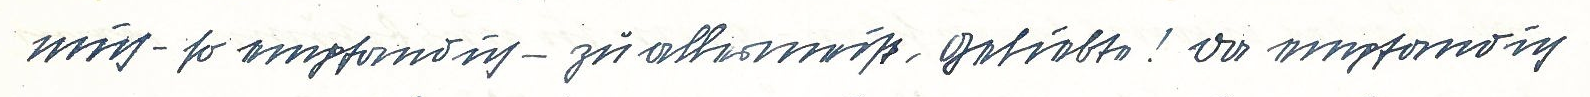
mich – so empfand ich – zu allermeist, Geliebte! Da empfand ich
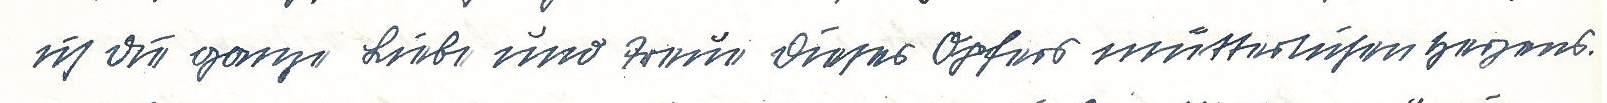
ich die ganze Liebe und Treue dieses Opfers mütterlichen Herzens.
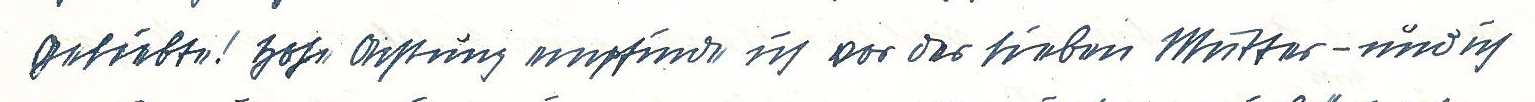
Geliebte! Hohe Achtung empfinde ich vor der lieben Mutter – und ich
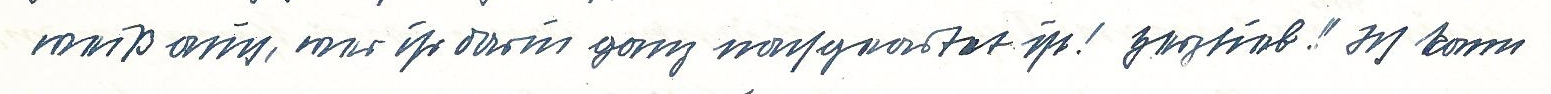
weiß auch, wer ihr darin ganz nachgeartet ist! Herzlieb!! Ich kann
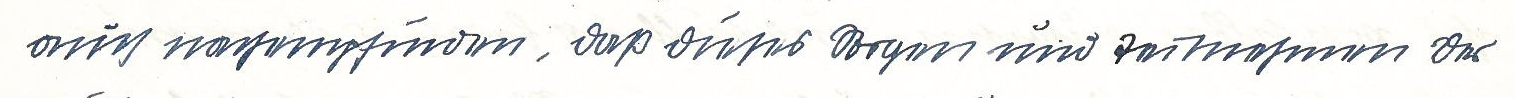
auch nachempfinden, daß dieses Sorgen und Teilnehmen der
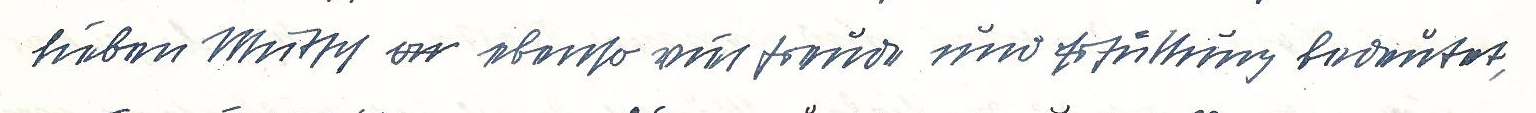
lieben Mutter an ebenso viel Freude und Erfüllung bedeutet,
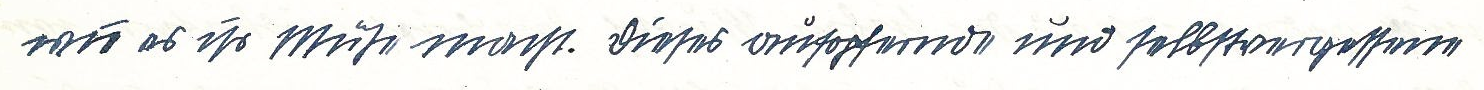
wie es ihr Mühe macht. Dieses aufopfernde und selbstvergessene
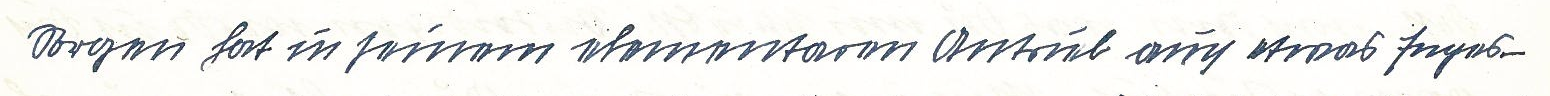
Sorgen hat in seinem elementaren Antrieb auch etwas Enges –
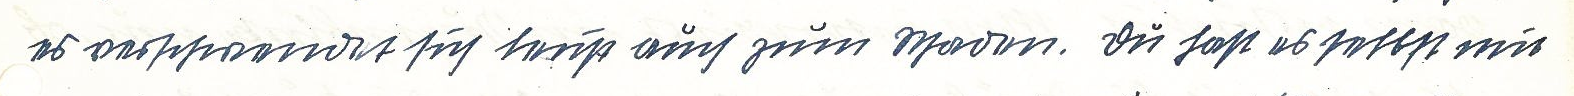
es verschwendet sich leicht auch zum Schaden. Du hast es selbst mit
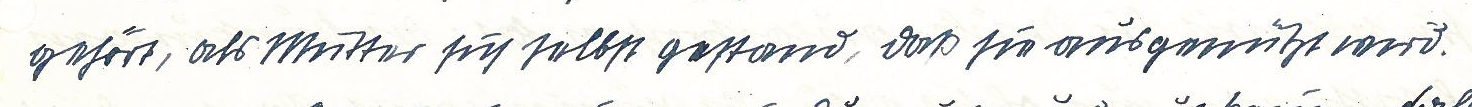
gehört, als Mutter sich selbst gestand, daß sie ausgenützt wird.
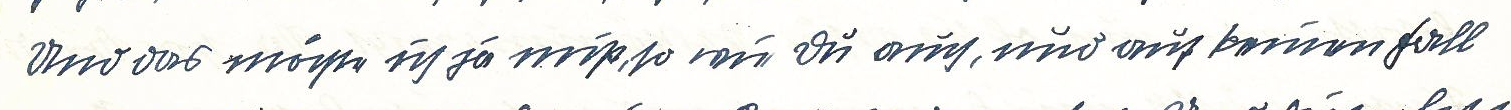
Und das möchte ich ja nicht, so wie Du auch, und auf keinen Fall
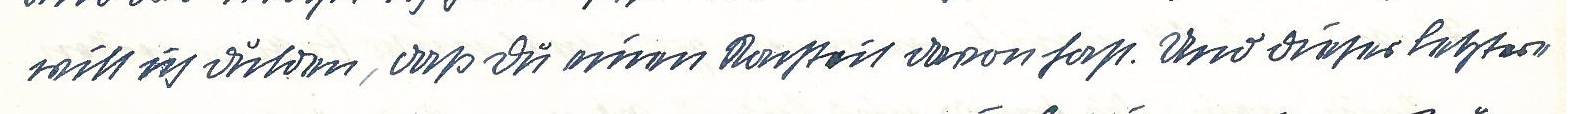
will ich dulden, daß Du einen Nachteil davon hast. Und dieser letzte
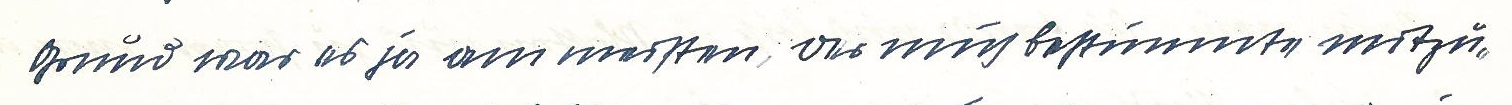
Grund war es ja am meisten, der mich bestimmte mitzu¬
